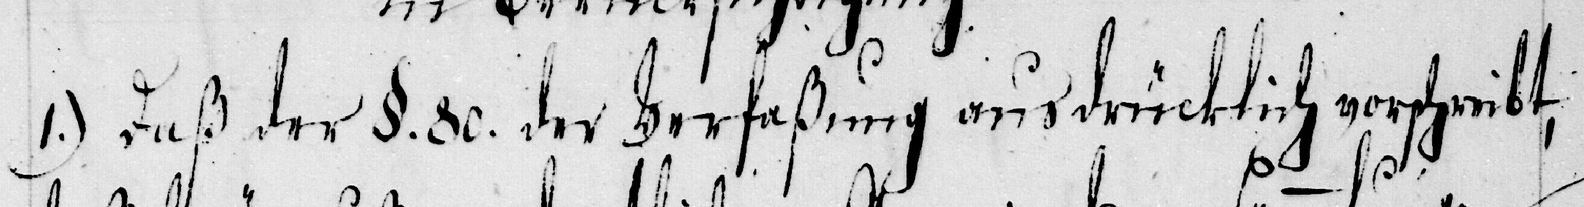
1.) Daß der §. 80. der Verfaßung ausdrücklich vorschreibt,
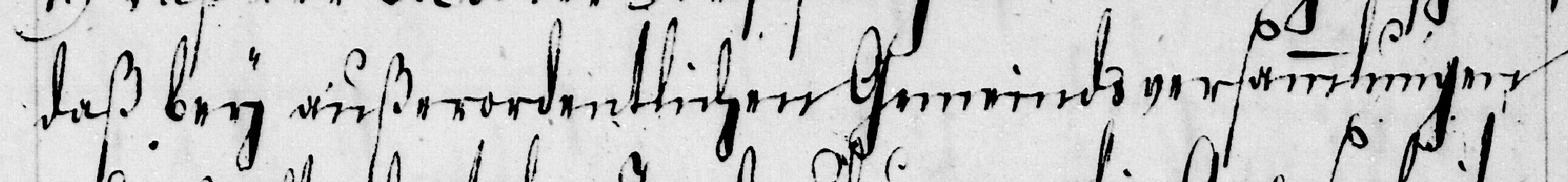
daß bey außerordentlichen Gemeindsversammlungen
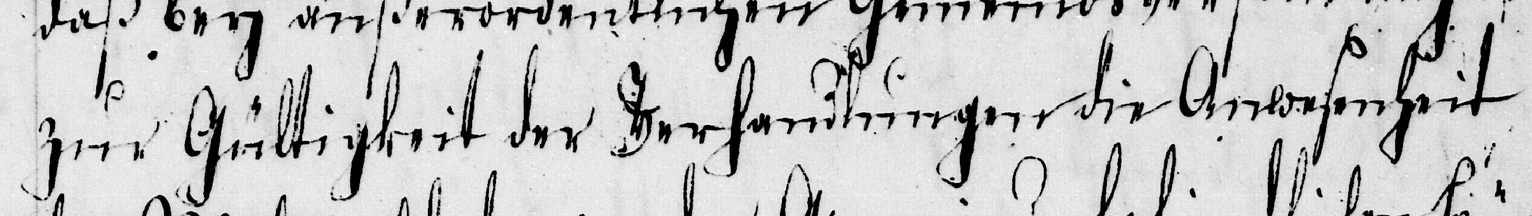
zur Gültigkeit der Verhandlung die Anwesenheit
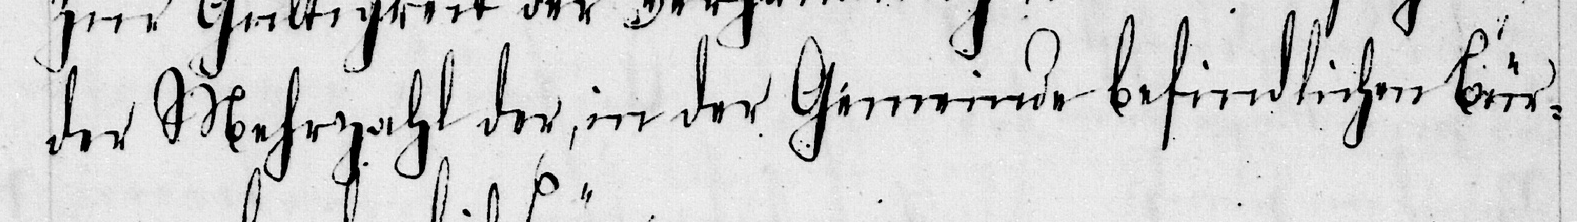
der Mehrzahl der, in der Gemeinde befindlichen Bür¬
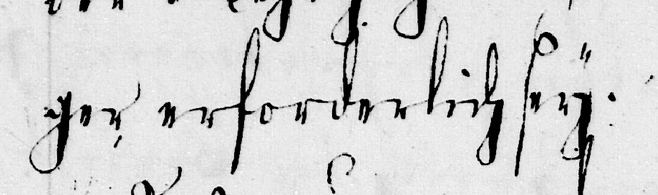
ger erforderlich sey.
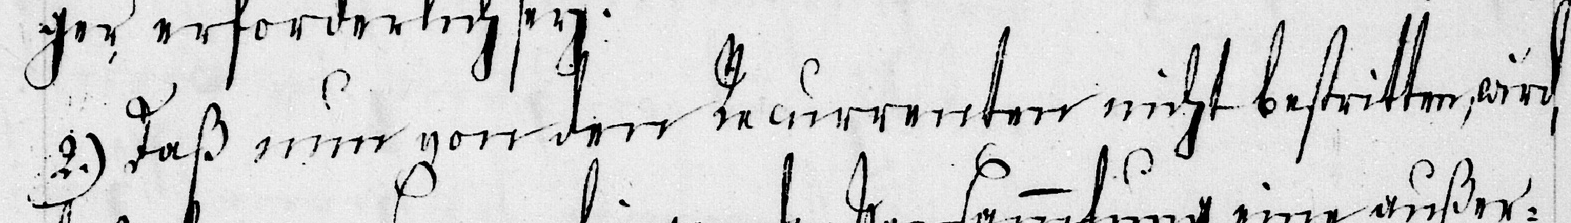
2.) Daß nun von den Recurrenten nicht bestritten wir¬
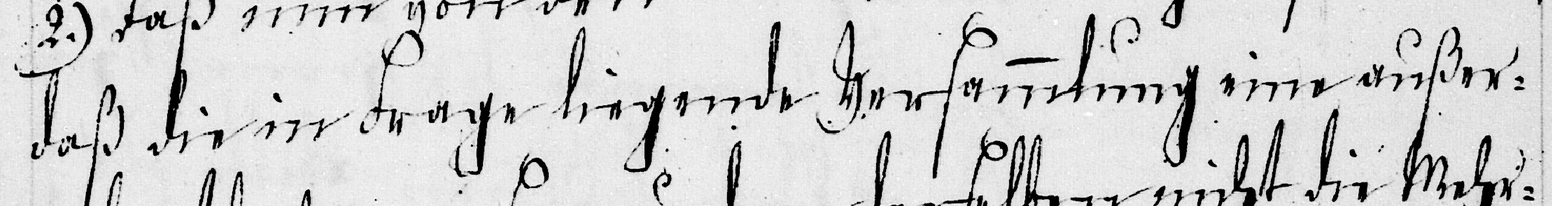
daß die in Frage liegende Versammlung eine außer¬
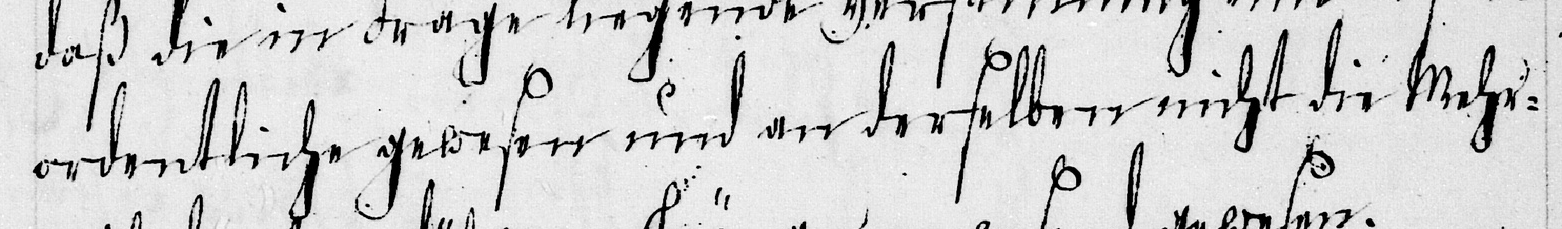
ordentliche gewesen und an derselben nicht die Mehr¬
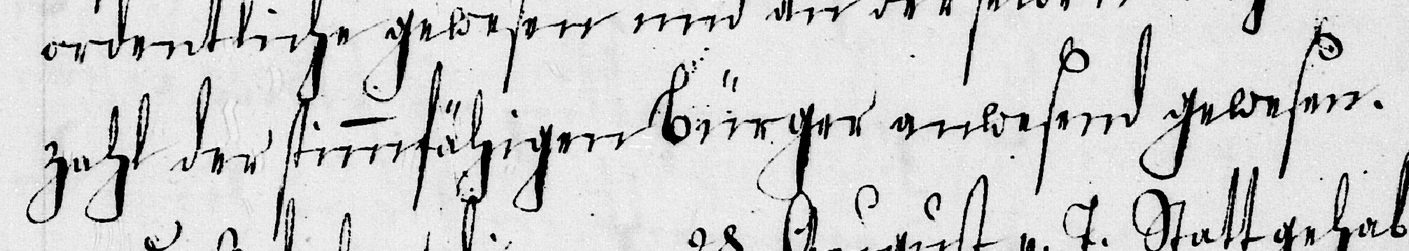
zahl der stimmfähigen Bürger anwesend gewesen.
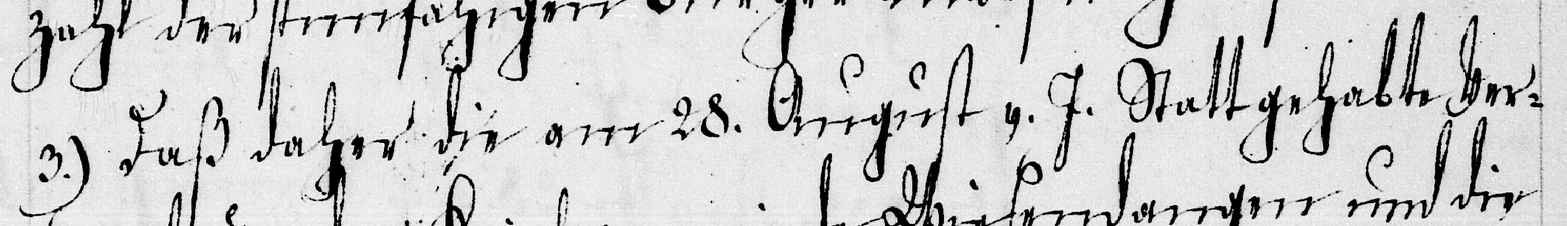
3.) Daß daher die am 28. August v. J. Statt gehabte Ver¬
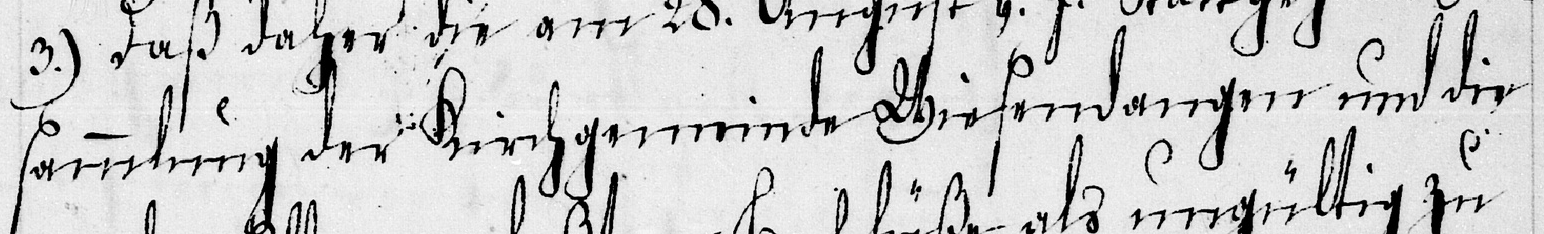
sammlung der Kirchgemeinde Wiesendangen und die
